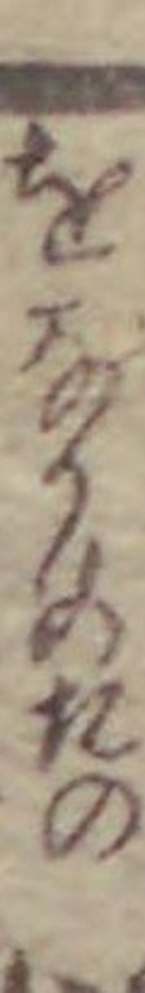をなかめたの
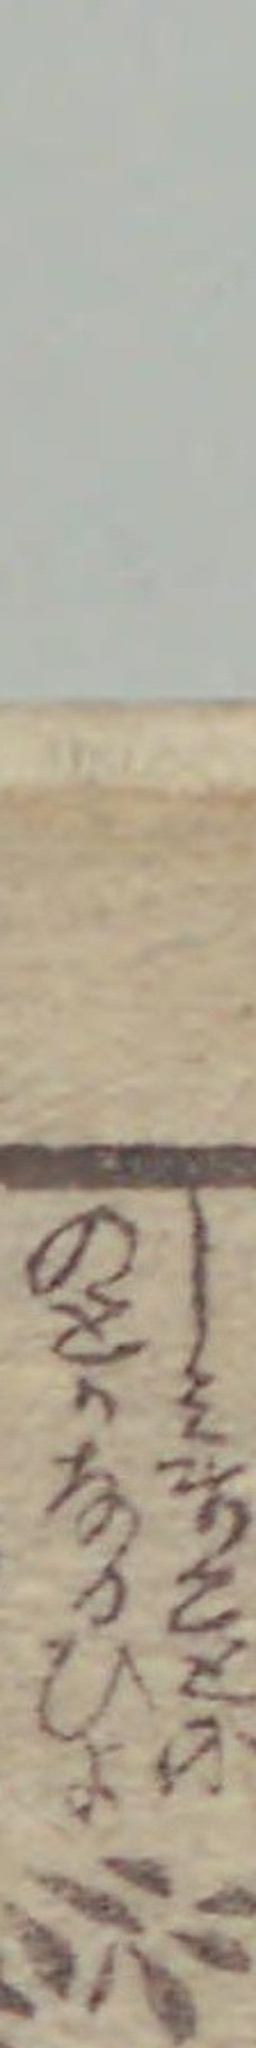のとかなるひよ
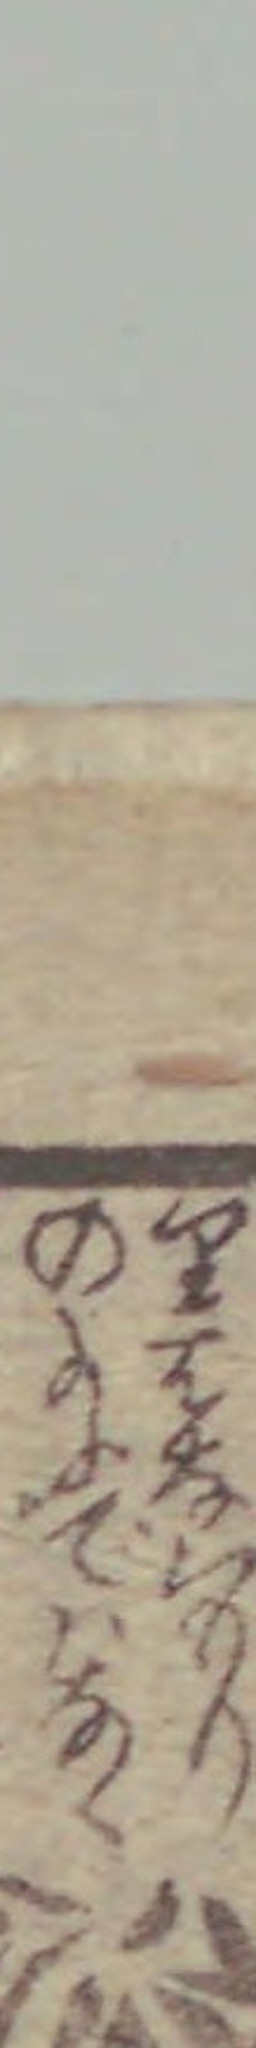のようではなく
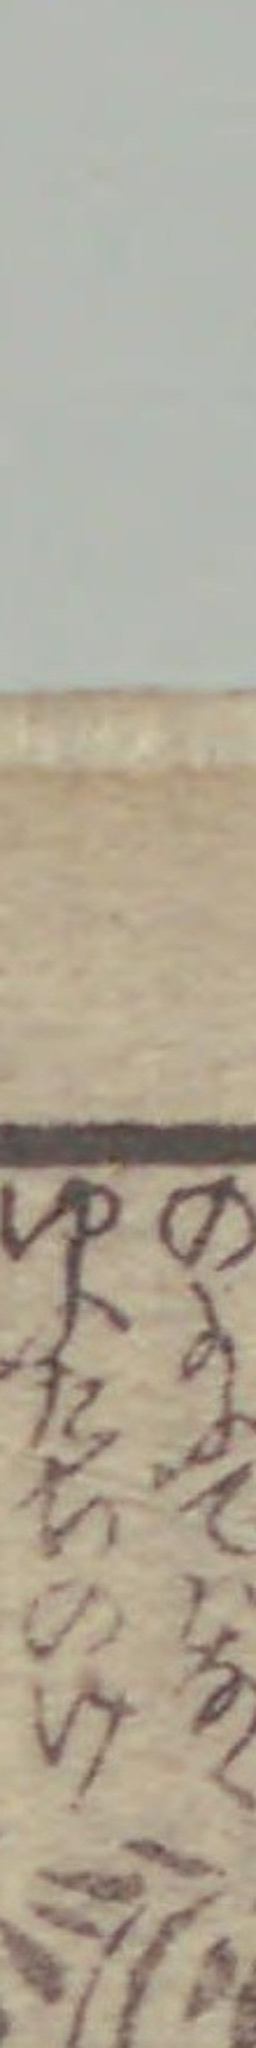ゆふたちのけ
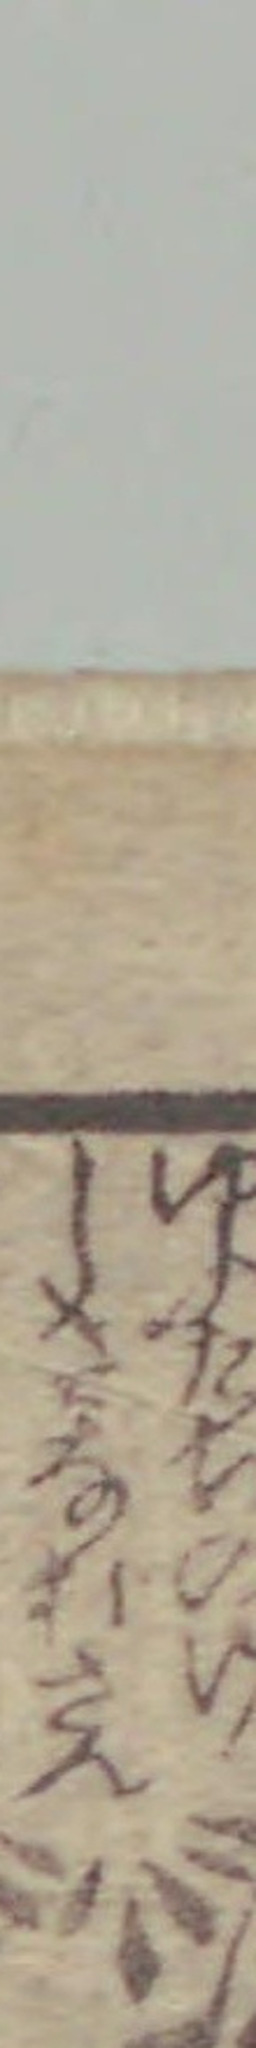しきなむさん
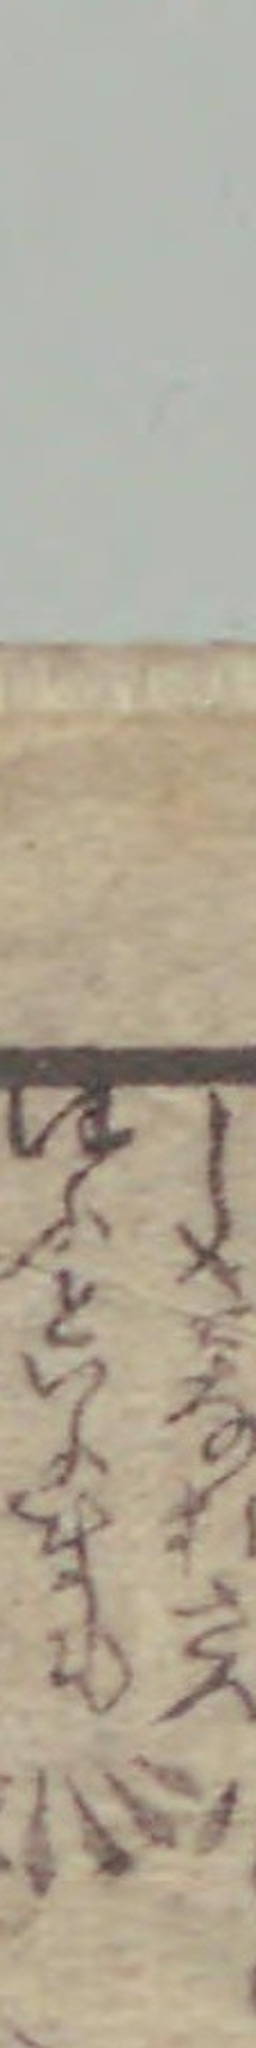ほふといふまも
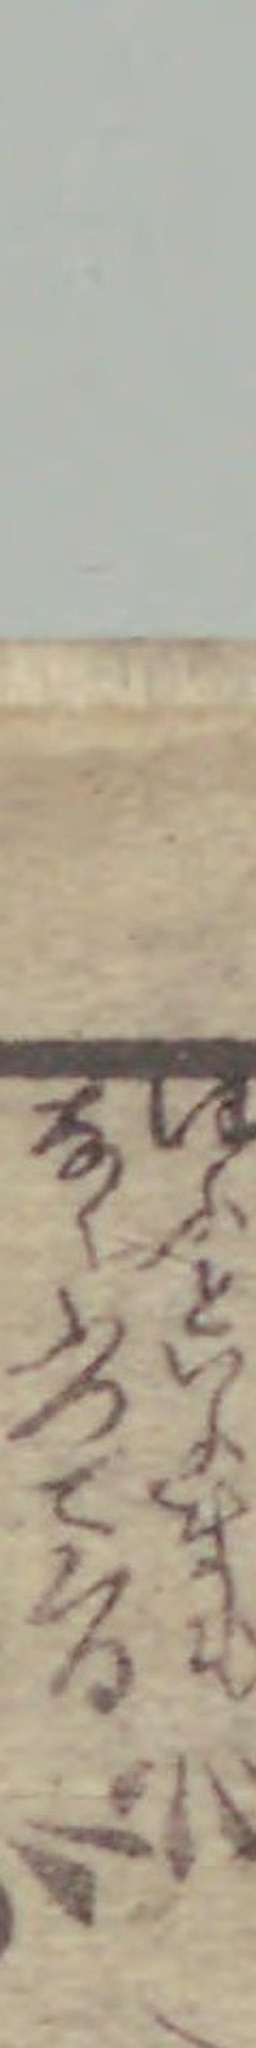なくふつてくる
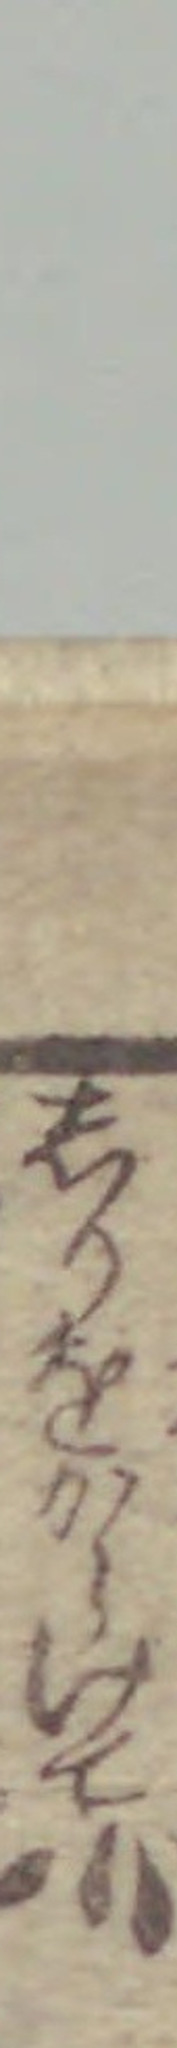しりをからけて
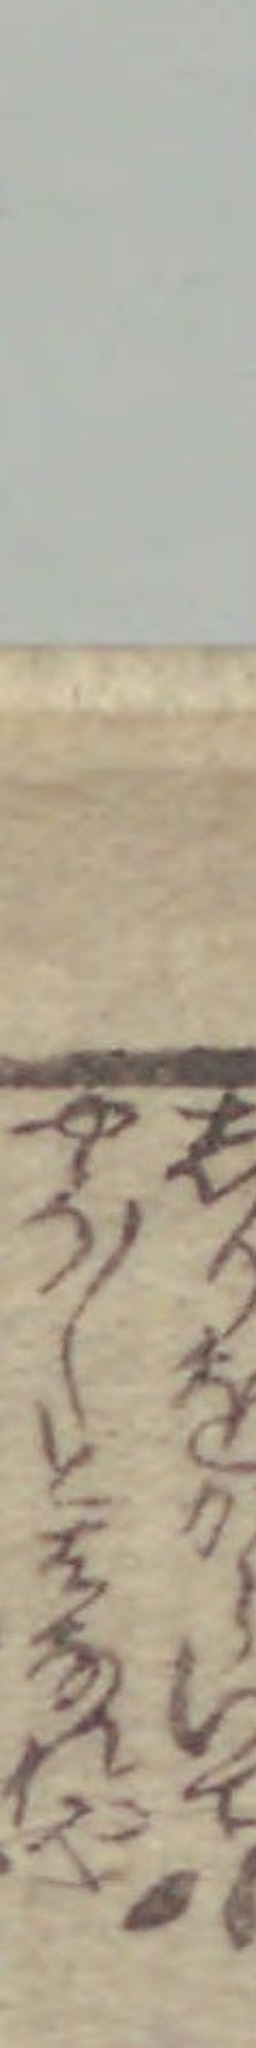やう〳〵とはなれや
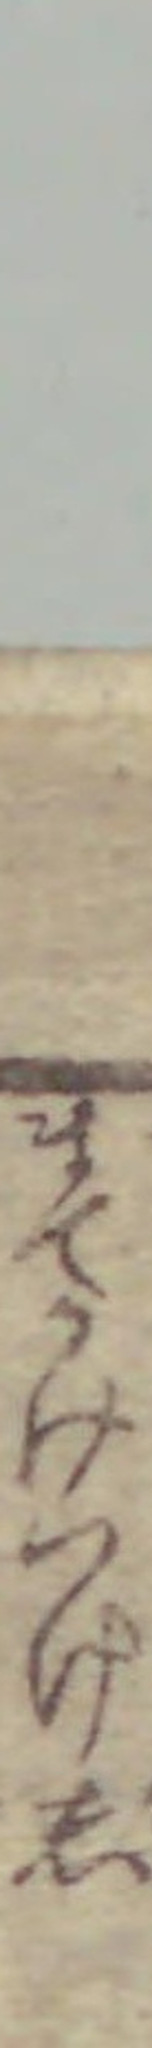まてかけつけし
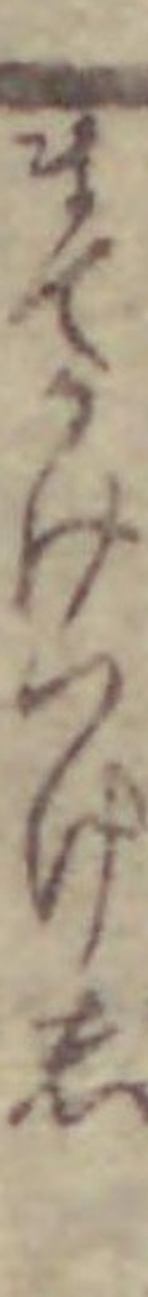まてかけつけし
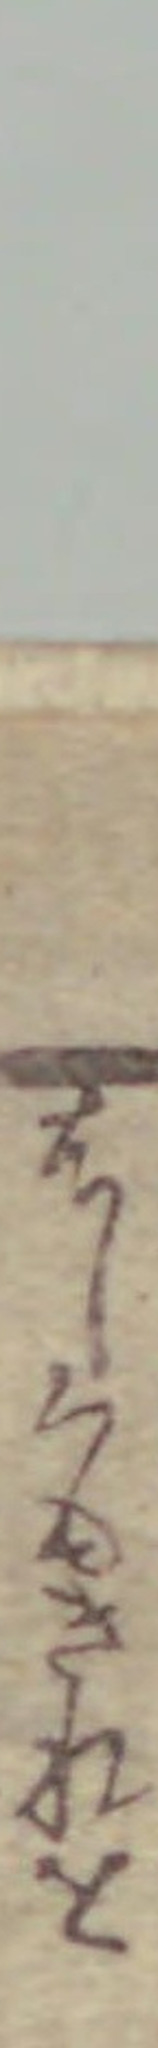はしくもきれを
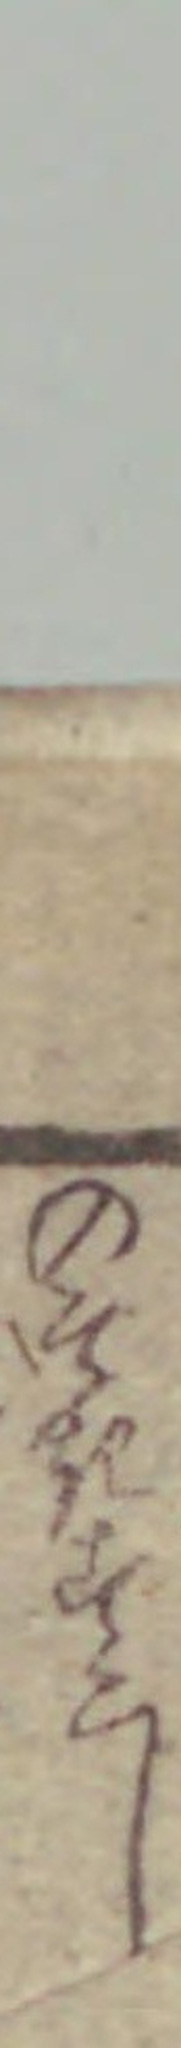のそきすこし
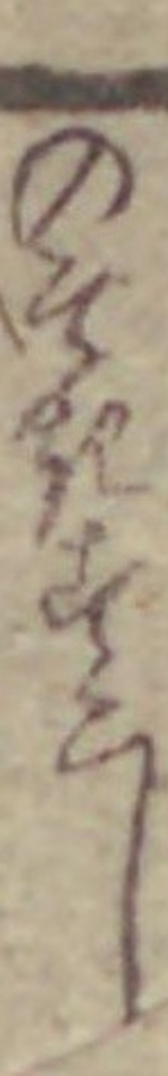のそきすこし
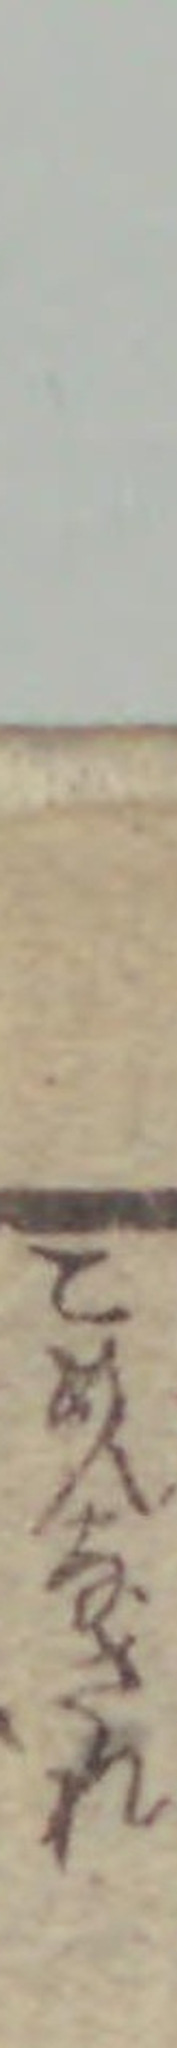こめんなされ
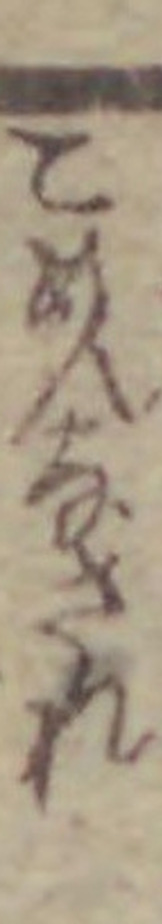こめんなされ
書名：思事夢濃枕 3巻
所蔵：国立国会図書館 National Diet Library, JAPAN
